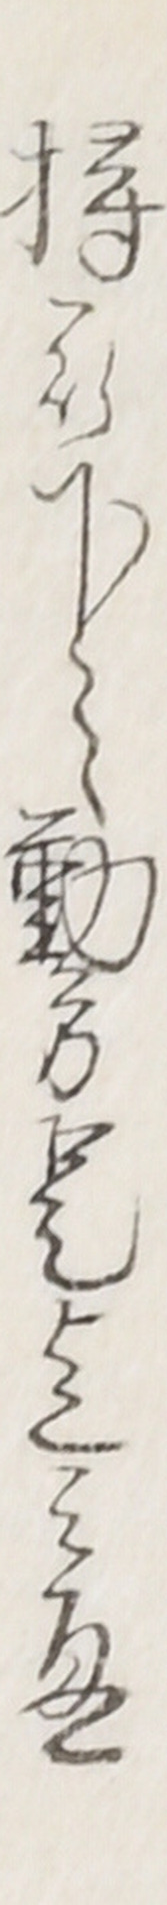持被下之勤方是迄之通
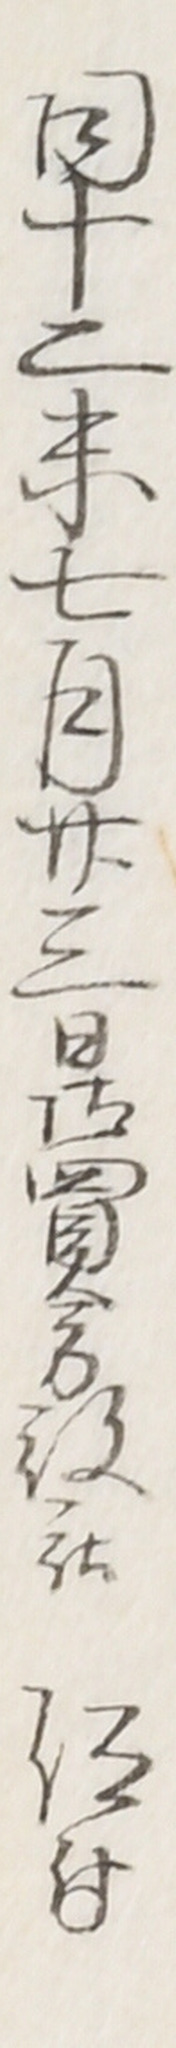一同十二未七月廿三日御買方役被仰付
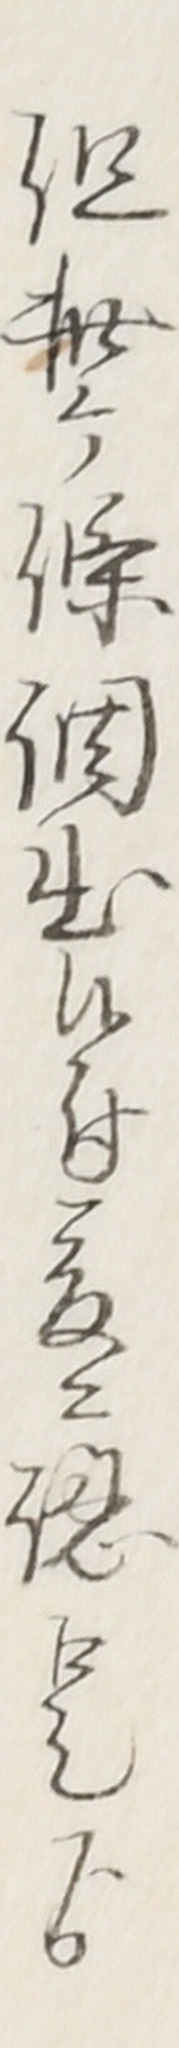但此ヶ條調出候付爰ニ認是ゟ
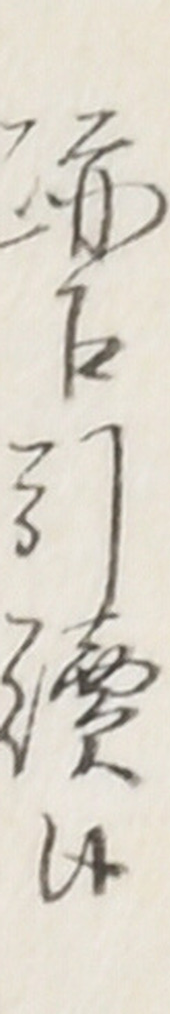跡江引続候
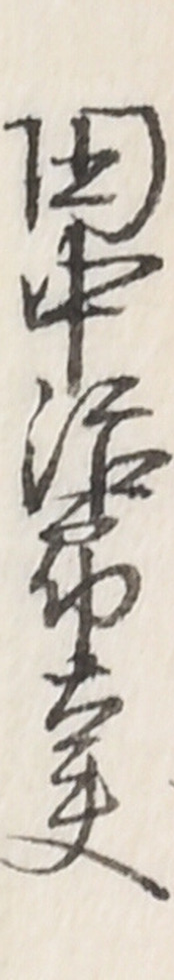田中治郎太夫
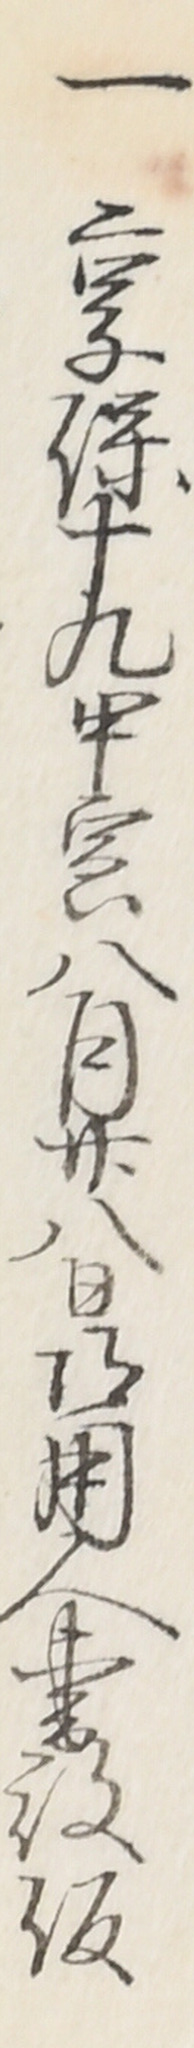一享保十九甲寅八月廿八日御用人書役仮
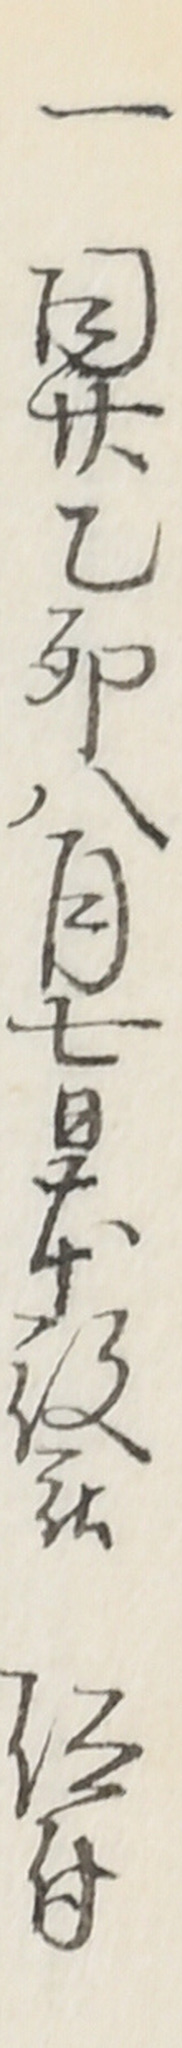一同廿乙卯八月七日本役被仰付
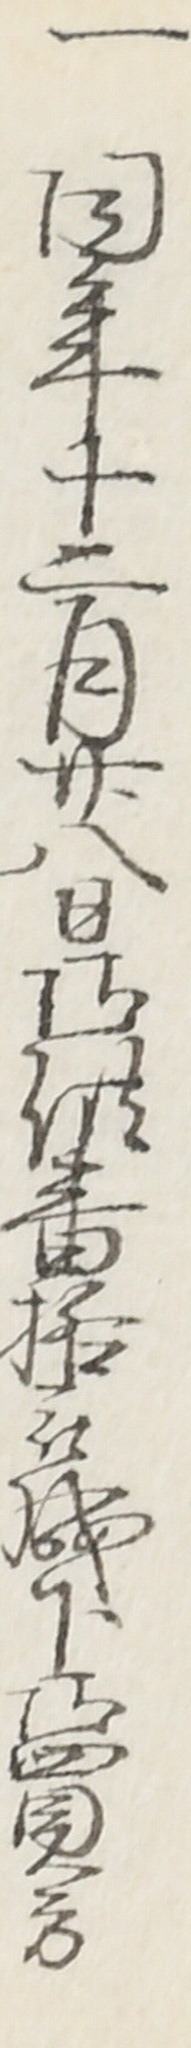一同年十二月廿八日御供番格被成下御買方
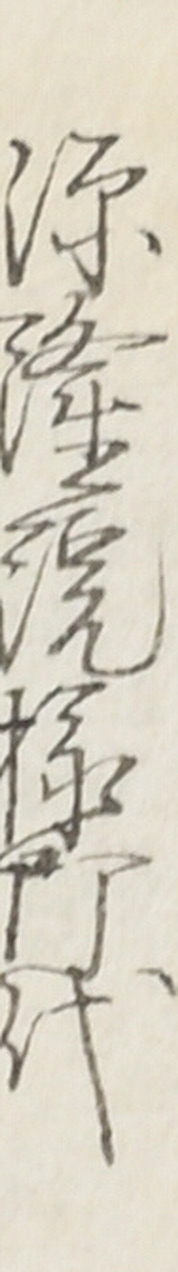源隆院様御代
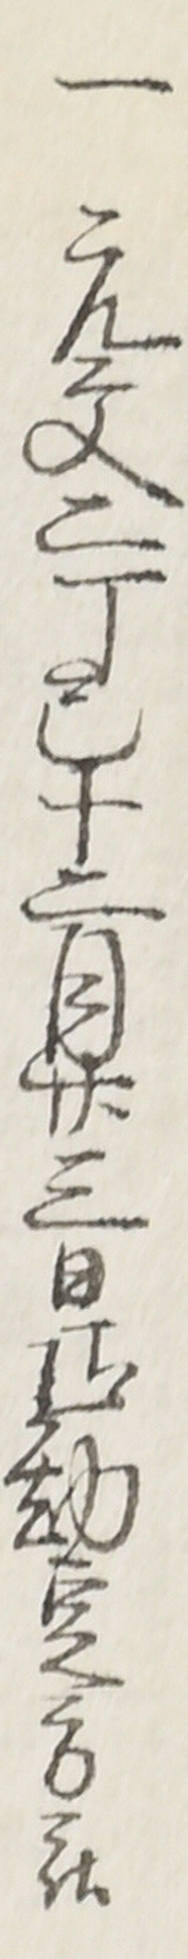一元文ニ丁巳十二月廿三日御勘定方被
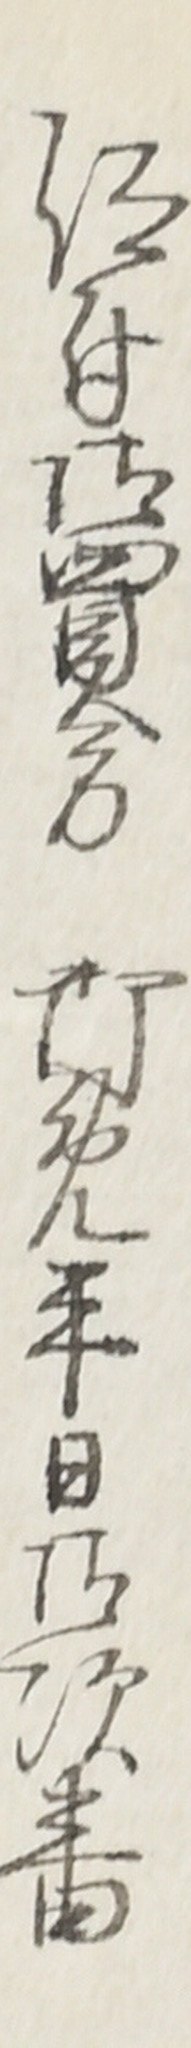仰付御買方御免平日御次番
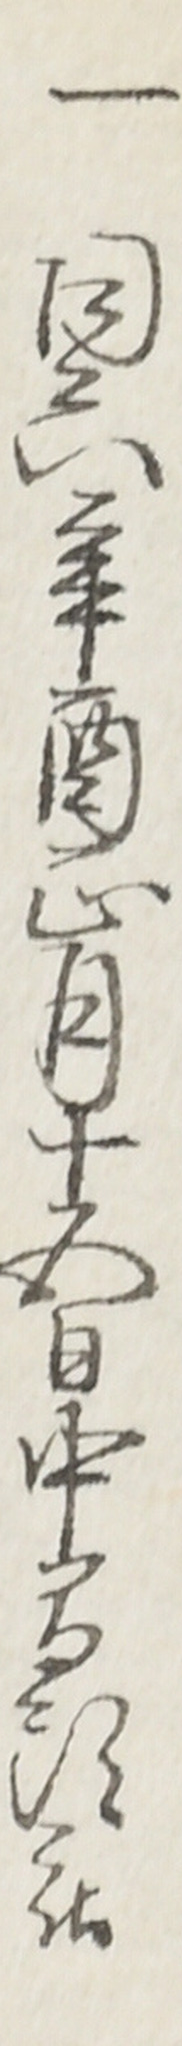一同六辛酉正月十五日中間頭被
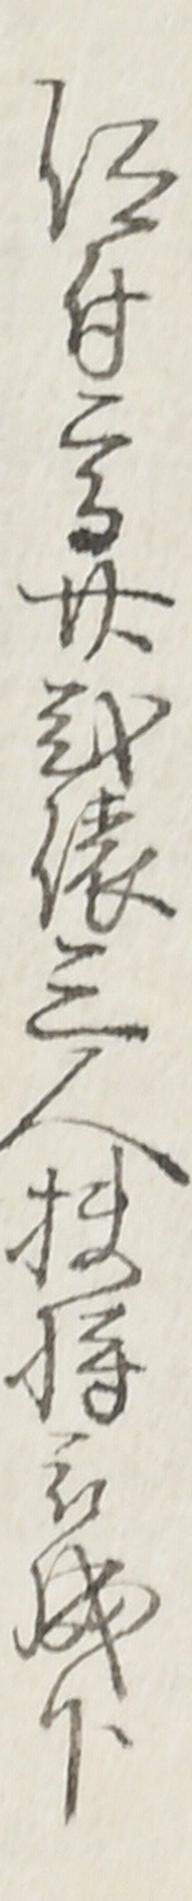仰付高廿弐俵三人扶持被成下
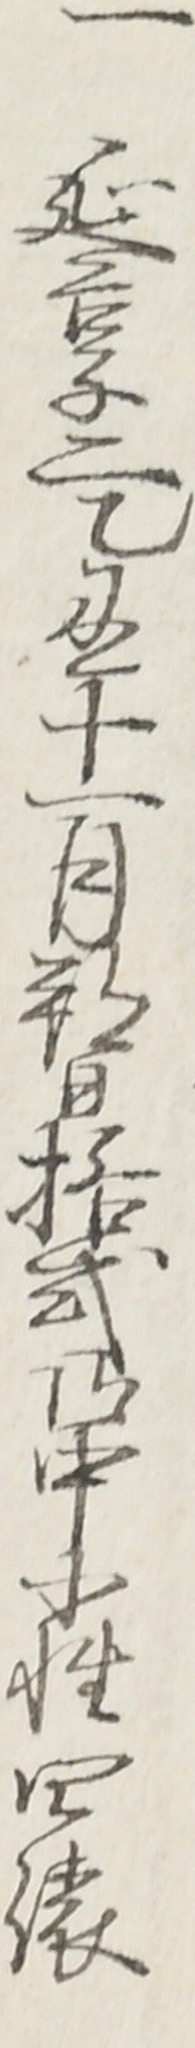一延享ニ乙丑十一月朔日格式御中小性四俵
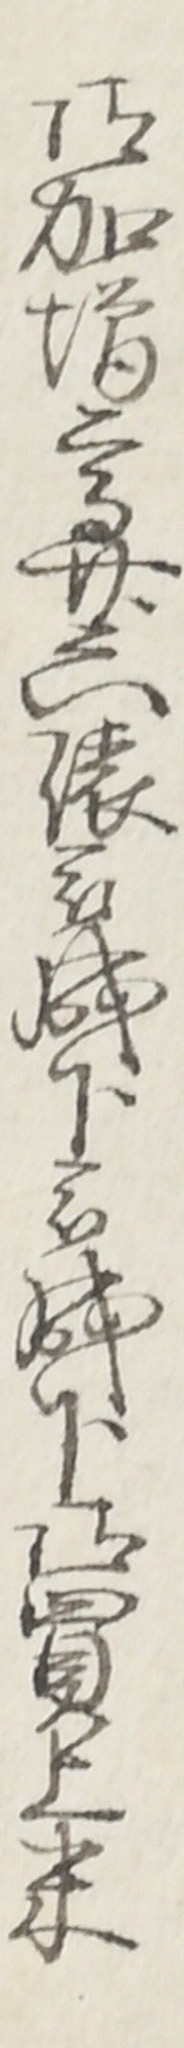御加増高廿六俵被成下被成下御買上米
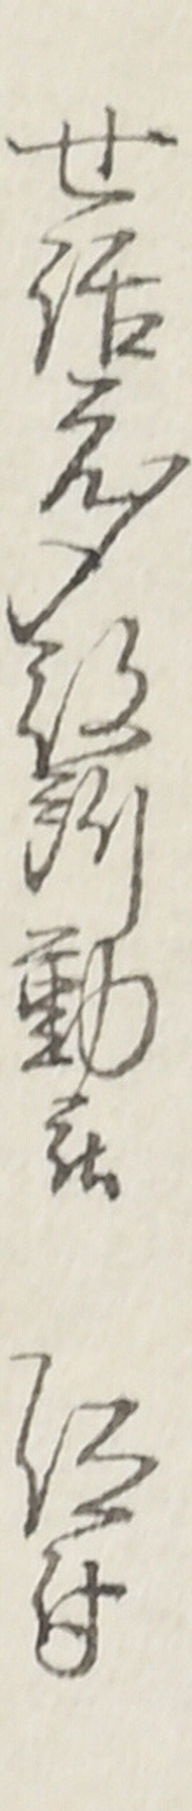世話元〆役所勤被仰付
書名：給人諸士勤仕録（七）
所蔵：伊那市立高遠町図書館・合同会社AMANE
